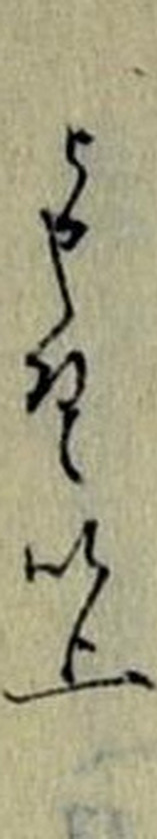被申付候以上
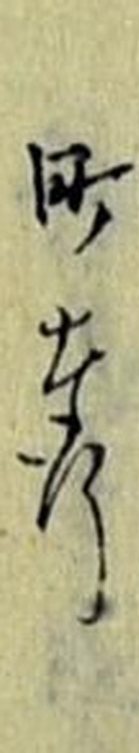町奉行
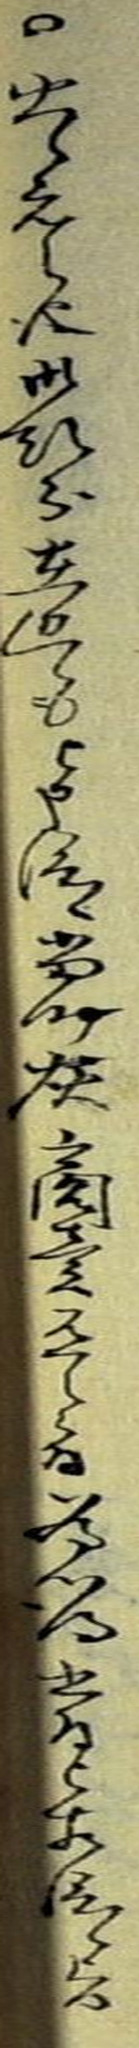〇火之元之儀御領分在辺へも被申渡候当町灰商売有之ニ付為心得書付被相渡候旨
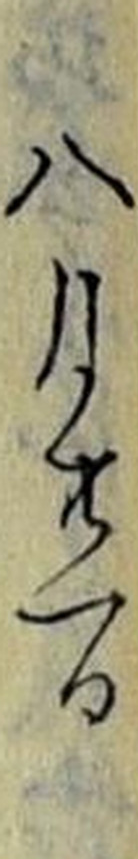八月廿一日
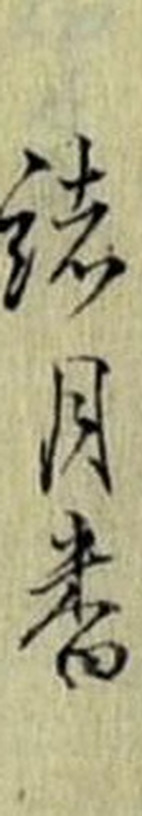諸月番
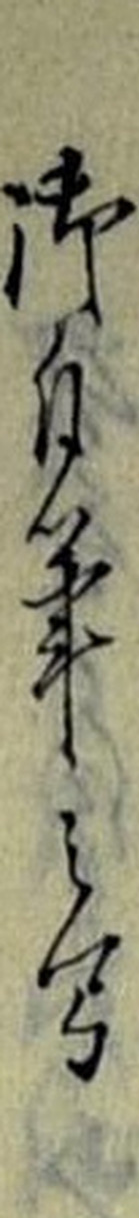御自筆之写
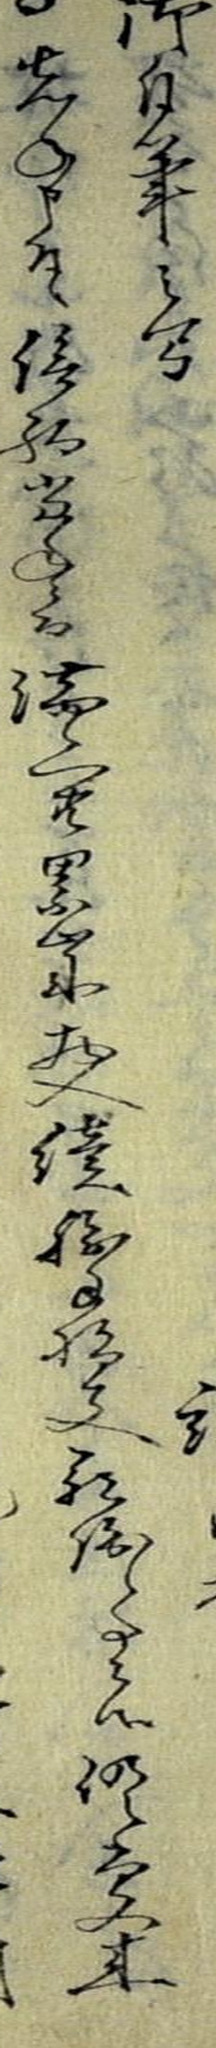〇先年申付候倹約当年ニ而満候へ共累歳物入続勝手指支難儀候事ニ候仍之尚又来
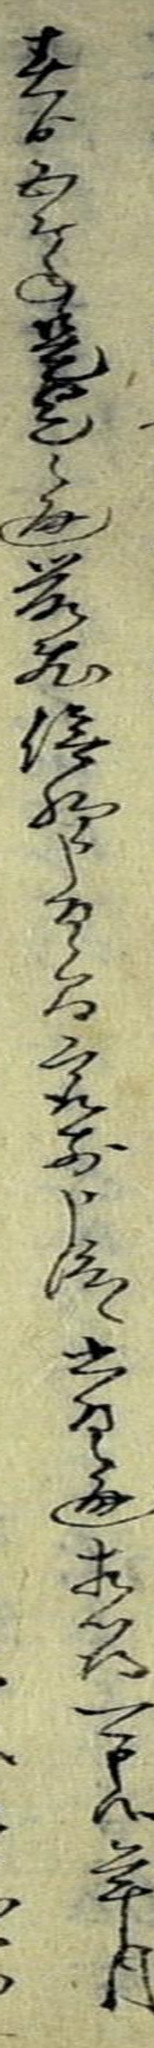春ゟ五ケ年是迄之通厳敷倹約申付候間最前申渡候書付之通相心得可申候年月
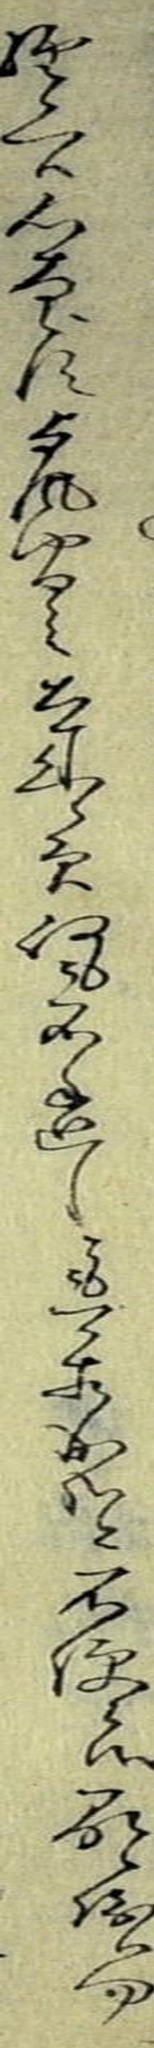経候ヘハ心ならすと風ゆるみ出来候而ハ何も不手廻しとも可相成哉と不便ニ候顕候儀ハ勿
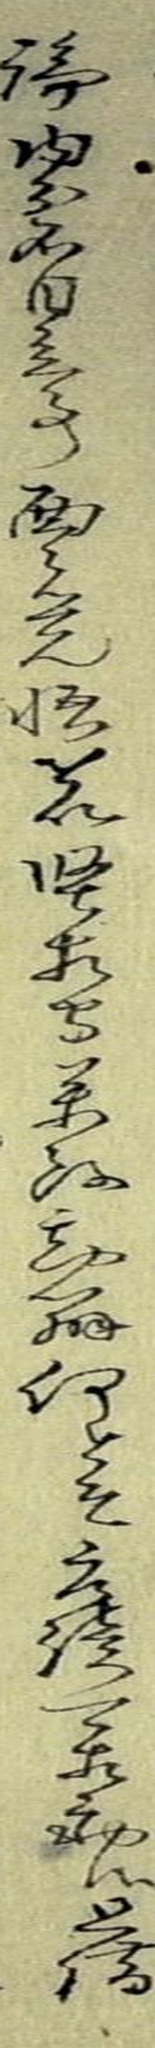論内分不目立事面々覚悟を以堅相守万致勘弁何とそ取続可相勤候且借
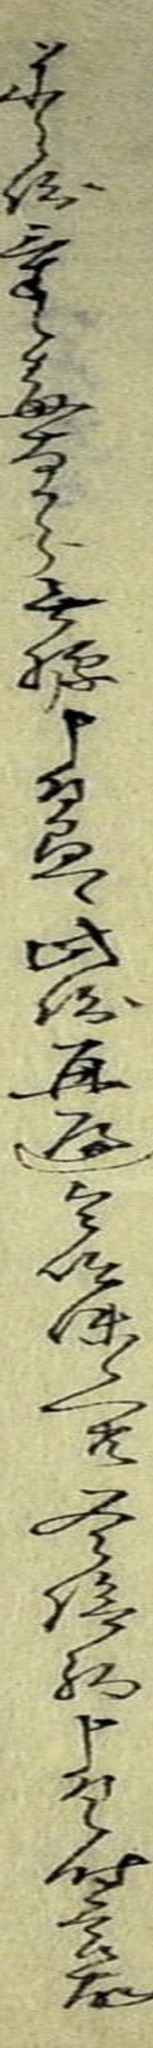米之儀気之毒なから無拠申付置候此儀再遍令吟味候へ共又々倹約申付候時節故
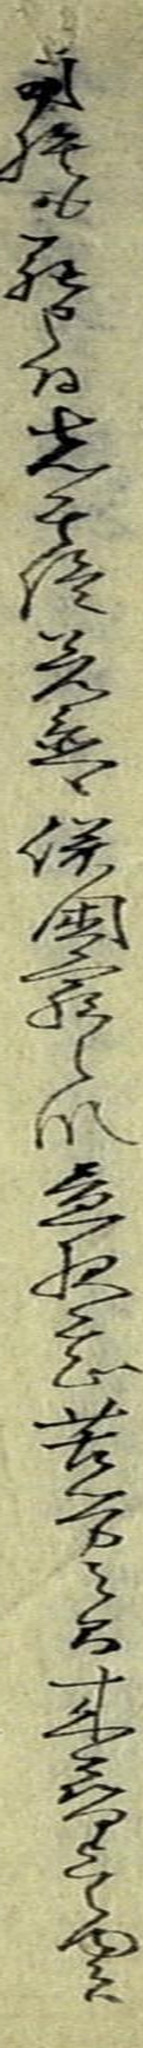用捨も難申付先其儘差置候併困窮之段昼夜甚苦労ニ候間来暮迄之内ニハ
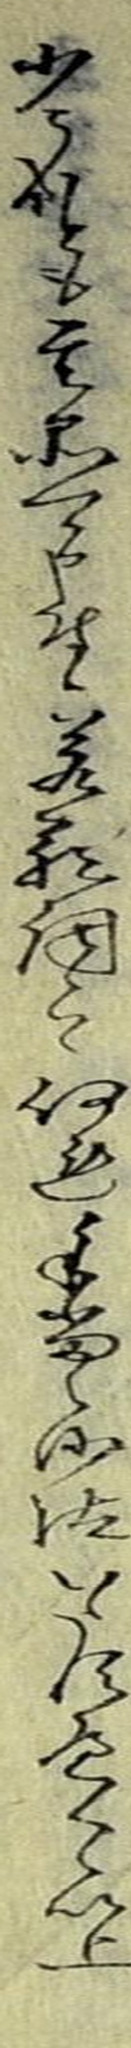少々成とも其品可申付候若難調候ハヽ何れ手当之沙汰いたすへく候以上
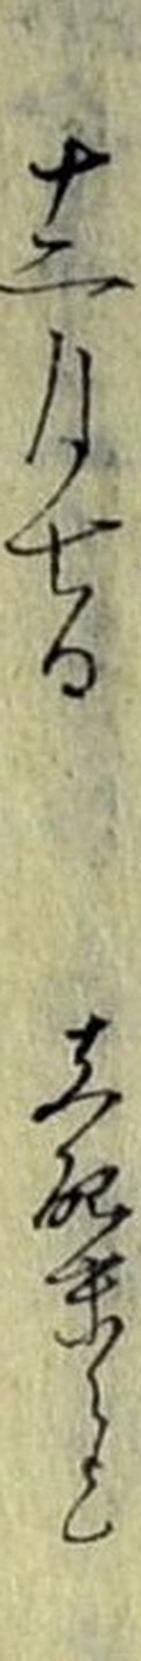十二月七日支配末々迄
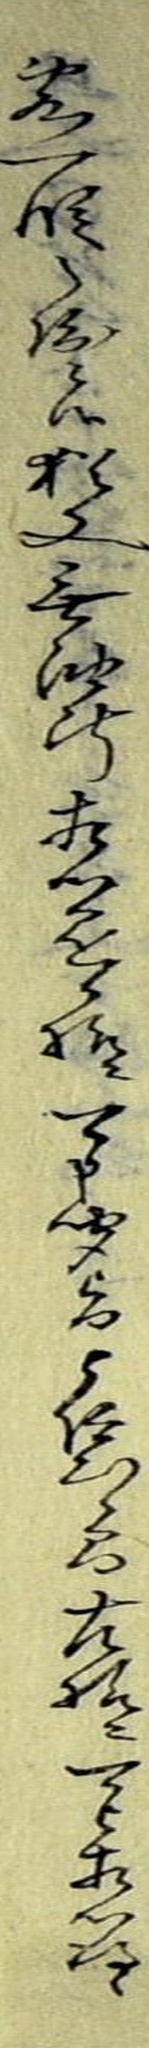敷一段之儀ニ候猶又無油断相心懸候様ニ可申聞旨被仰出候間左様ニ可被相心得候

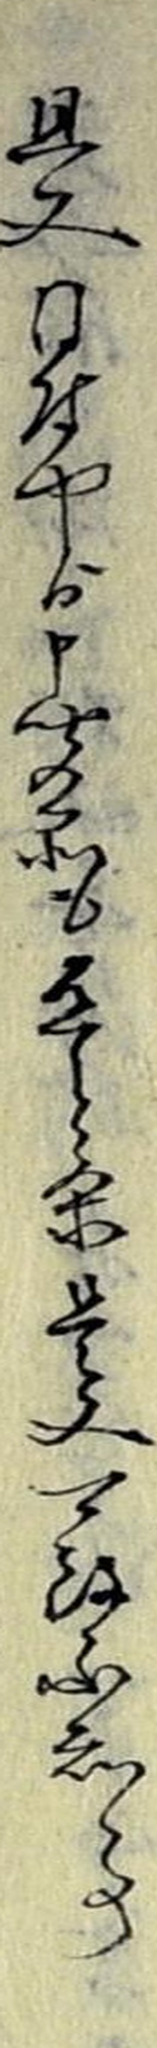且又目付中ゟ申聞品も有之候条是又可致承知事
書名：命令之部 一
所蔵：福井県文書館 Fukui Prefectural Archives
